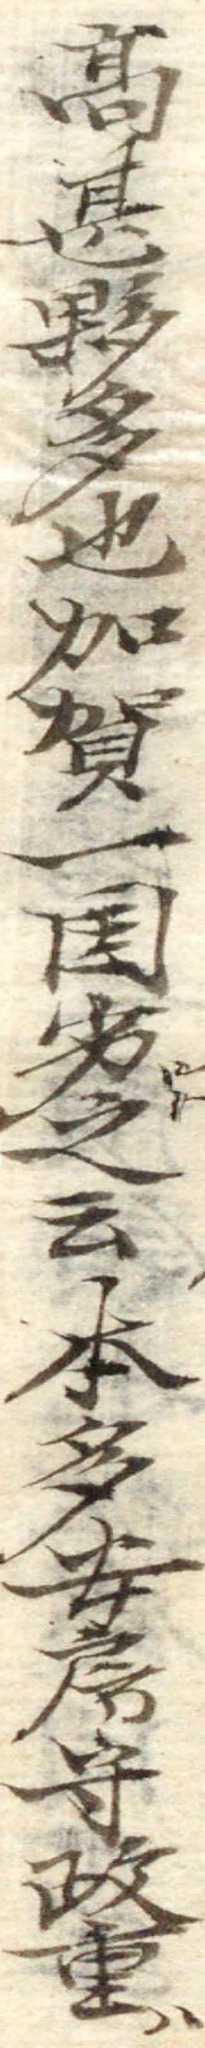高甚夥多也加賀一国劣ると之云本多安房守政重
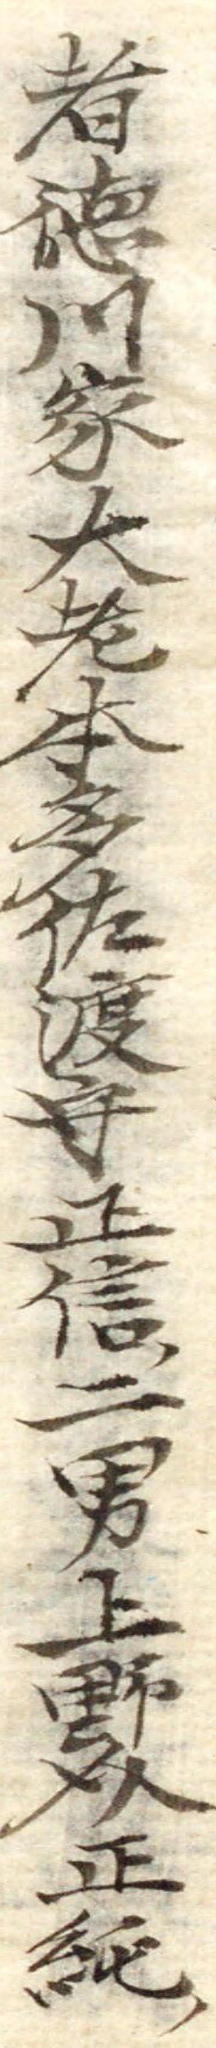者德川家大老本多佐渡守正信の二男上野介正純の
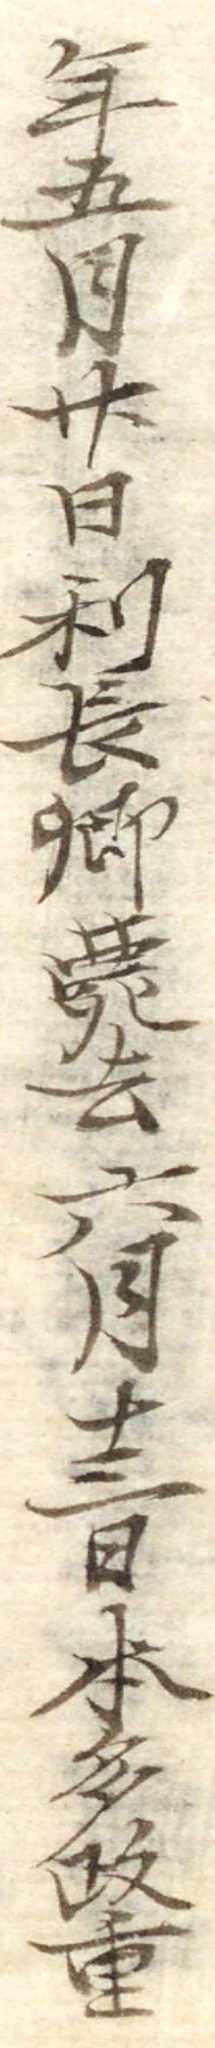年五月廿日利長卿薨去六月十三日本多政重
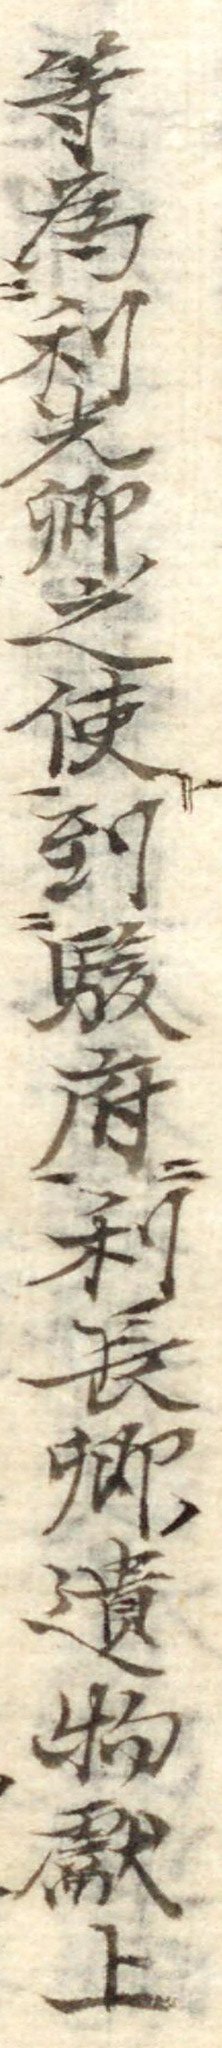等為利光卿之使と到駿府に利長卿の遺物献上
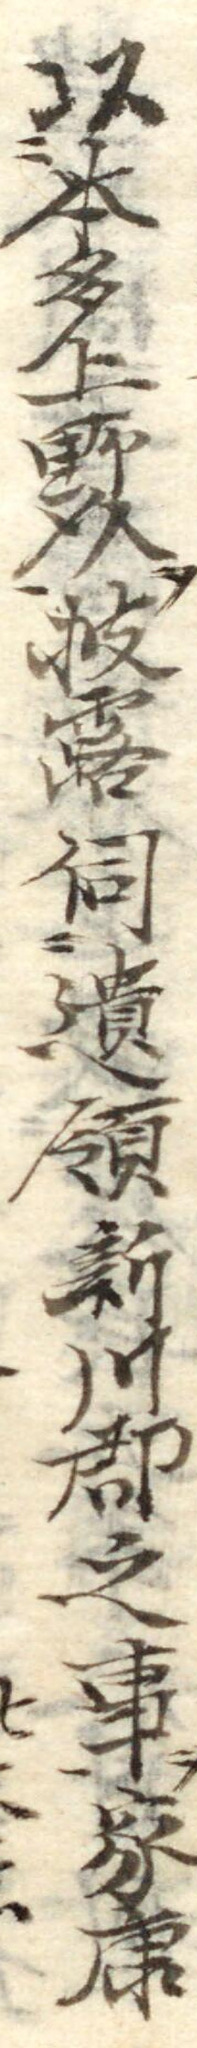以本多上野介を披露伺遺領新川郡之事を家康
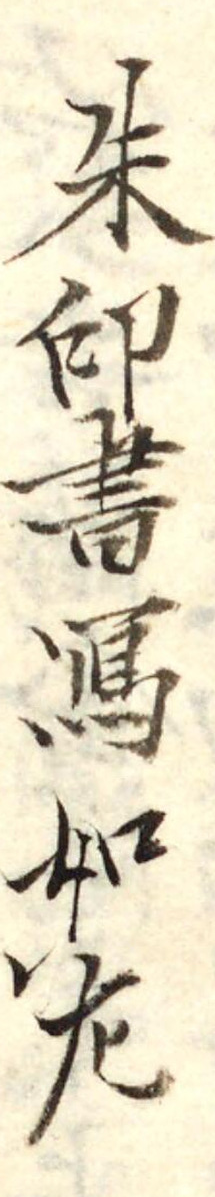朱印書写如左
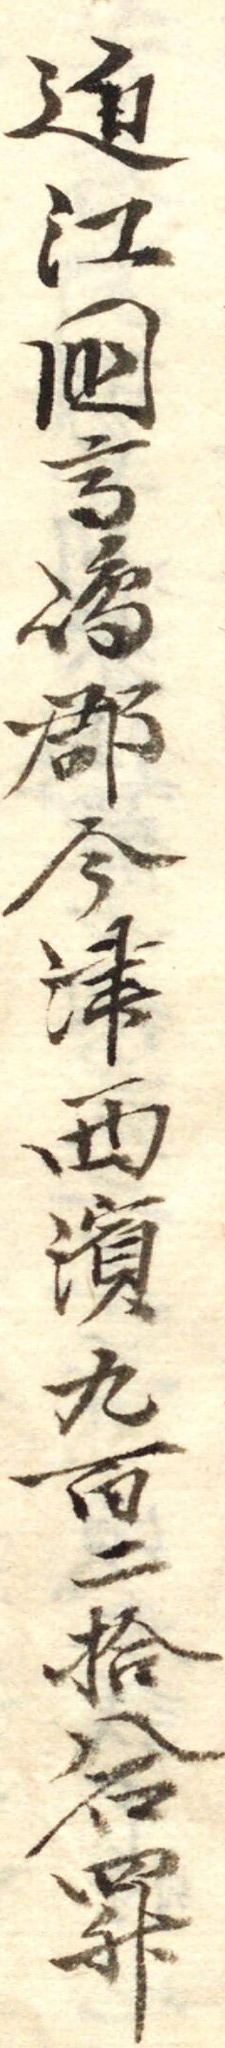近江国高島郡今津西浜九百二拾八石四升
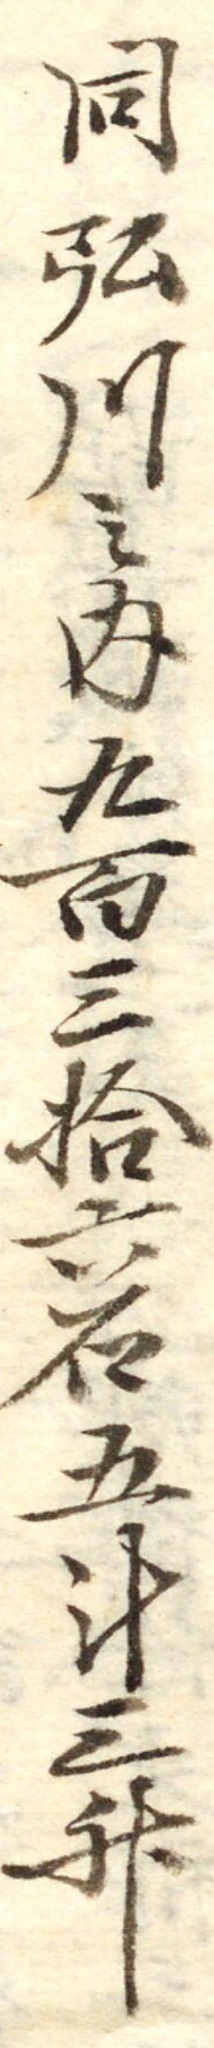同弘川之内九百三拾六石五斗三升
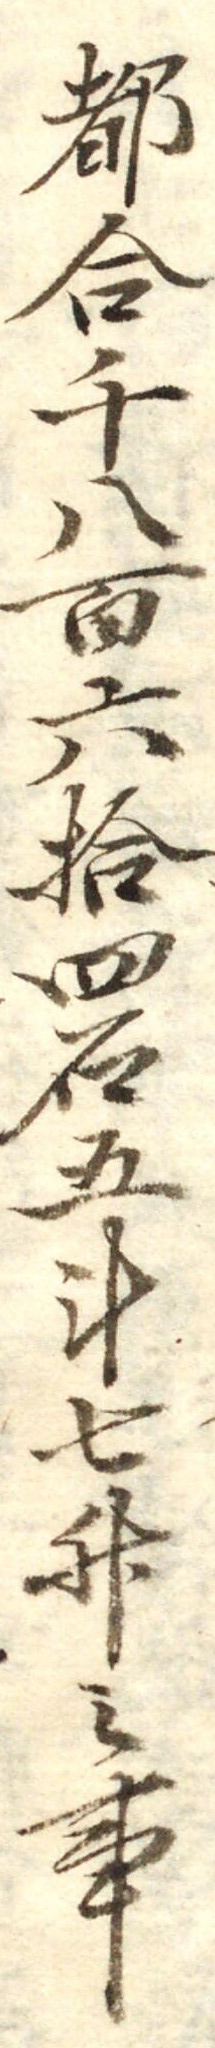都合千八百六拾四石五斗七升之事
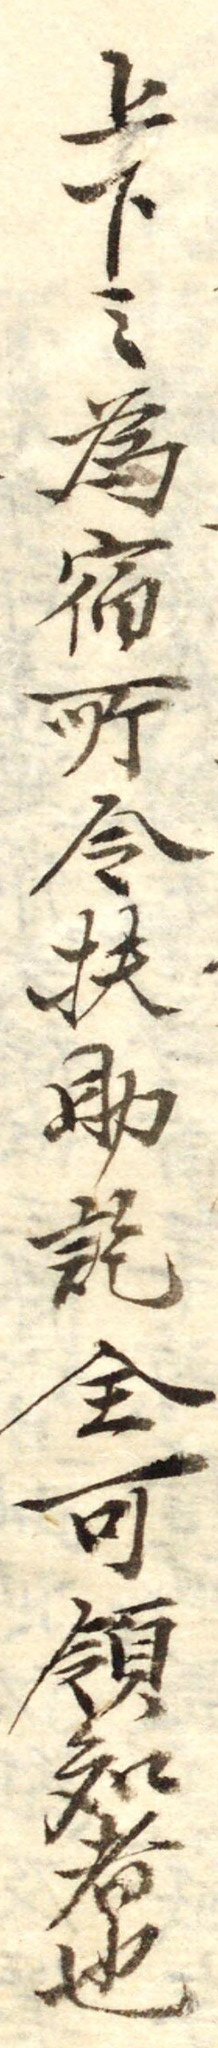上下之為宿所令扶助訖全可領知者也
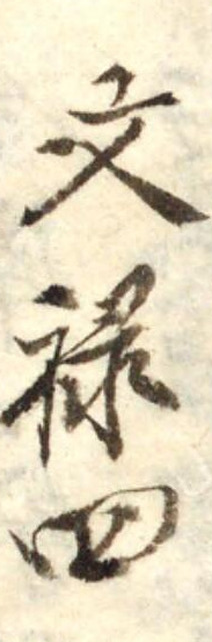文禄四
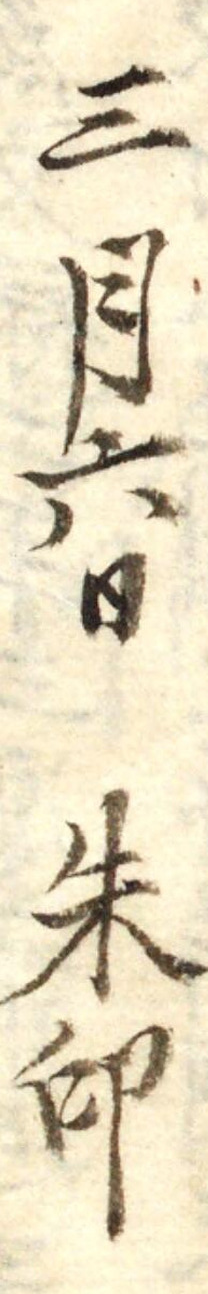三月六日朱印
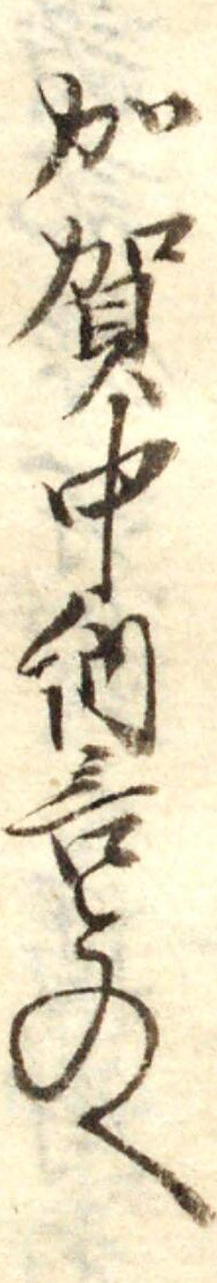加賀中納言とのへ

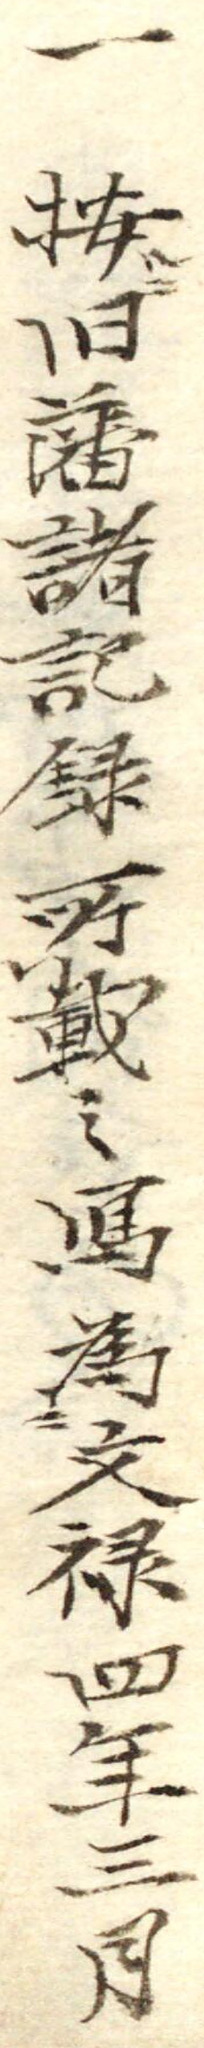一按に旧藩譜記録所載之写為文禄四年三月
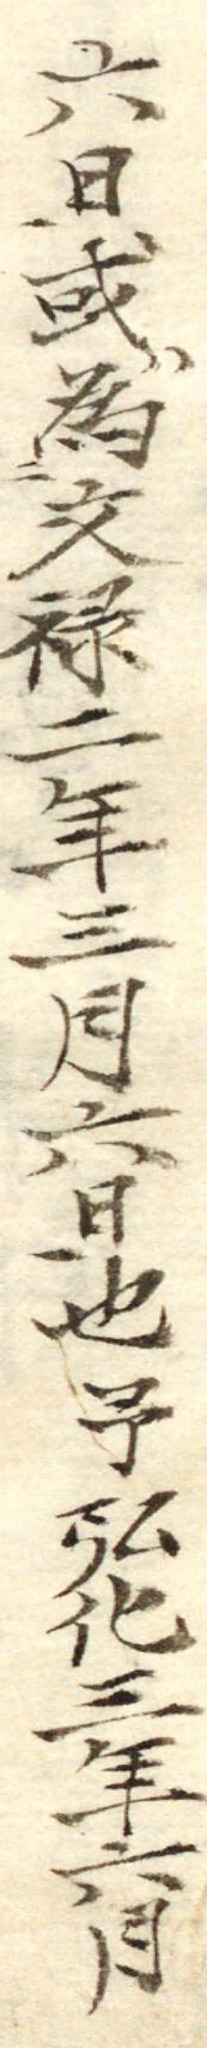六月或は為文禄二年三月六日也予弘化三年六月
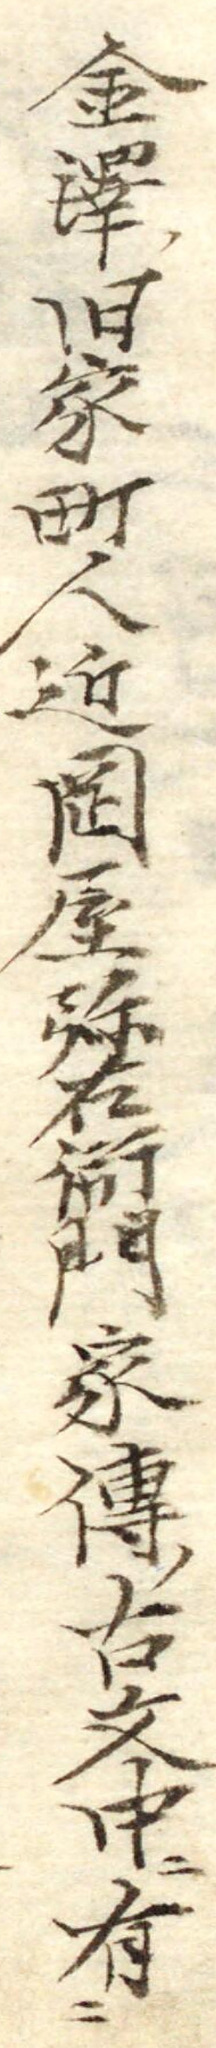金沢旧家町人近岡屋弥右衛門火家伝の古文中に有
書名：前田家封国証書集録
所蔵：Ishikawa Prefectural Library
